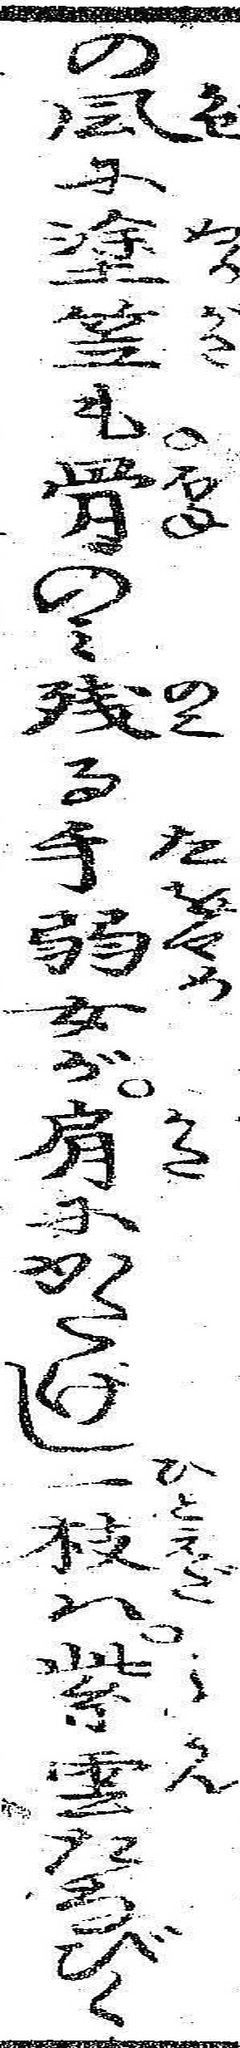の風に塗笠も。骨のみ残る手弱女が。肩にかたげし一枝は。紫雲たなびく
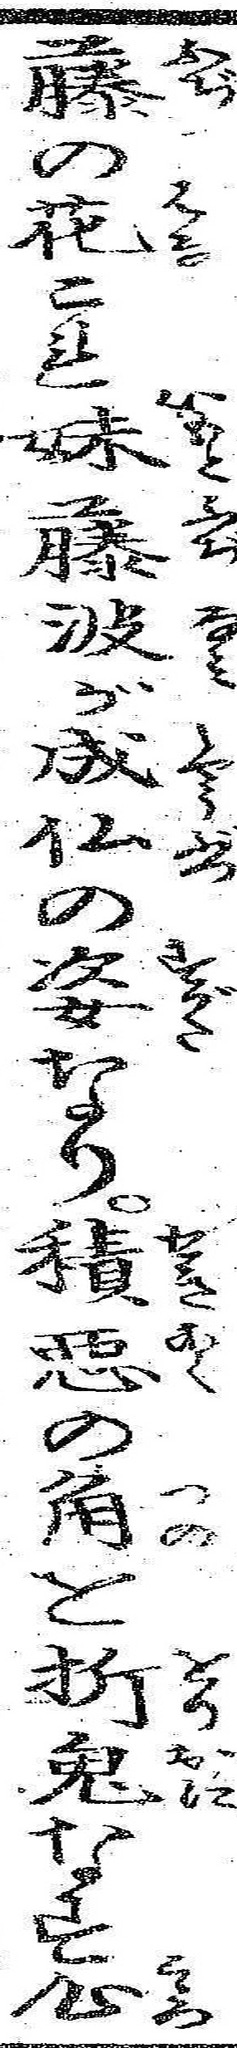藤の花これ妹藤波が成仏の姿なり。積悪の角を折鬼なす心
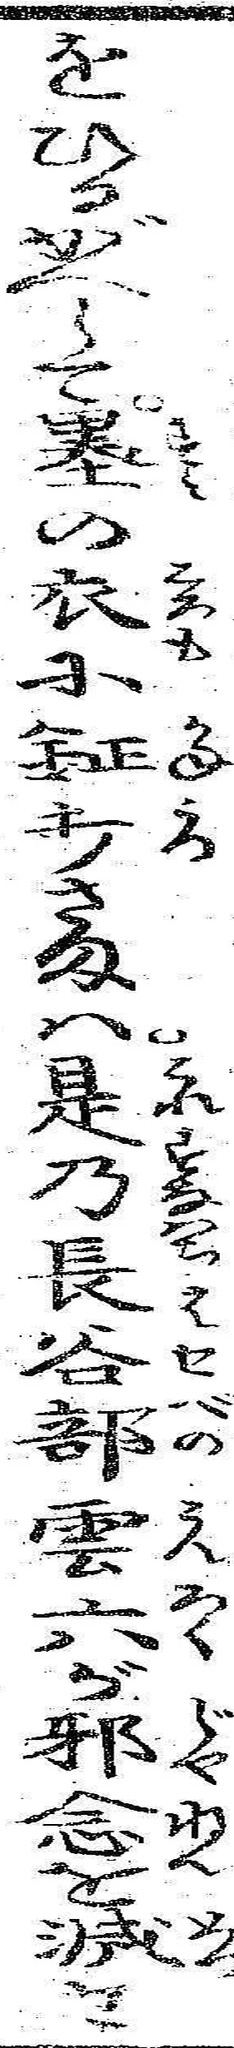をひるがへして。墨の衣に鉦打さまは。是乃長谷部雲六が邪念を滅せ
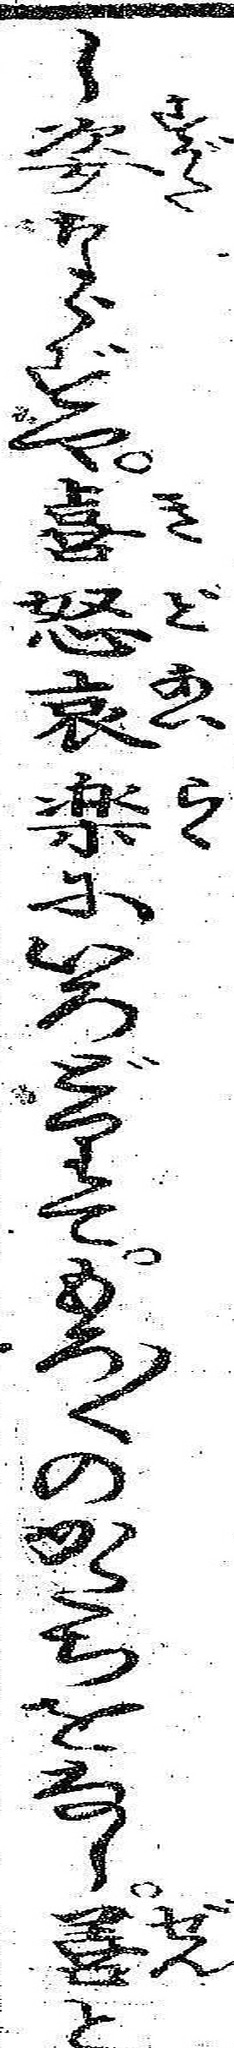し姿ならずや。喜怒哀楽にいろどりて。もろ〳〵のかたちをなし。善と
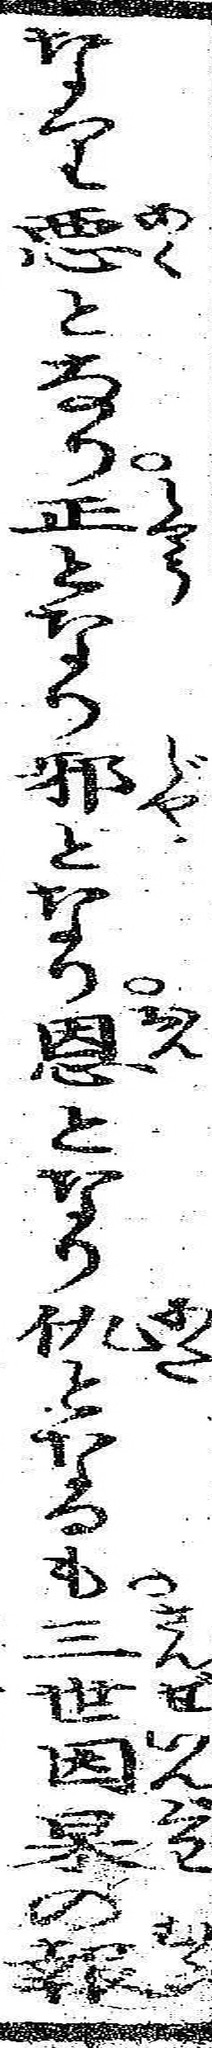なり悪となり。正となり邪となり。恩となり仇となるも。三世因果の報
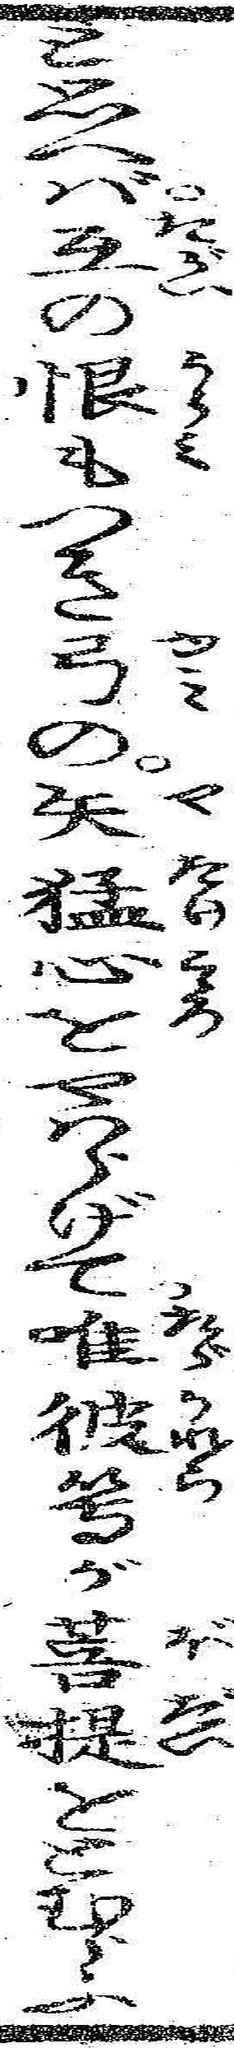と思へば。互の恨もつき弓の。矢猛心をやはらげて。唯彼等が菩提をとむらふ
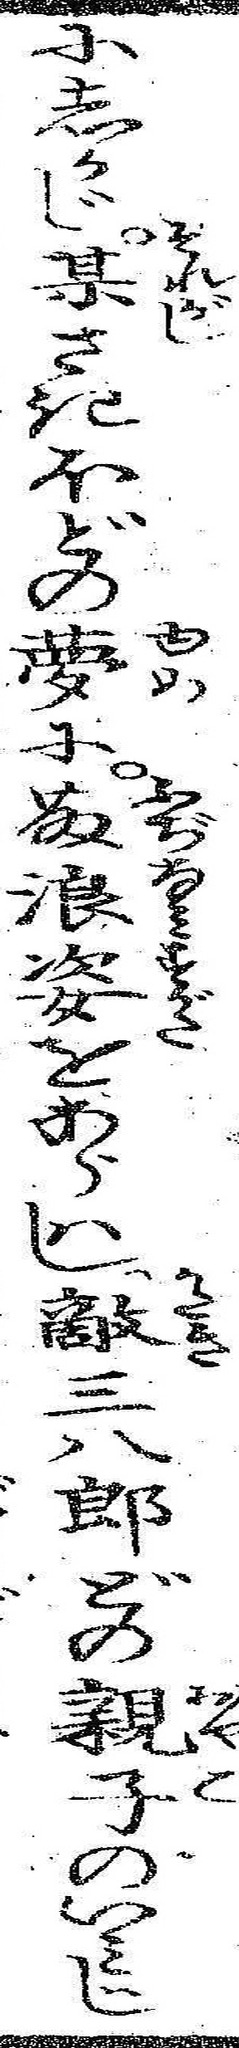にしかじ。某さきほどの夢に。藤浪姿をあらはし。敵三八郎どの親子のいみじ
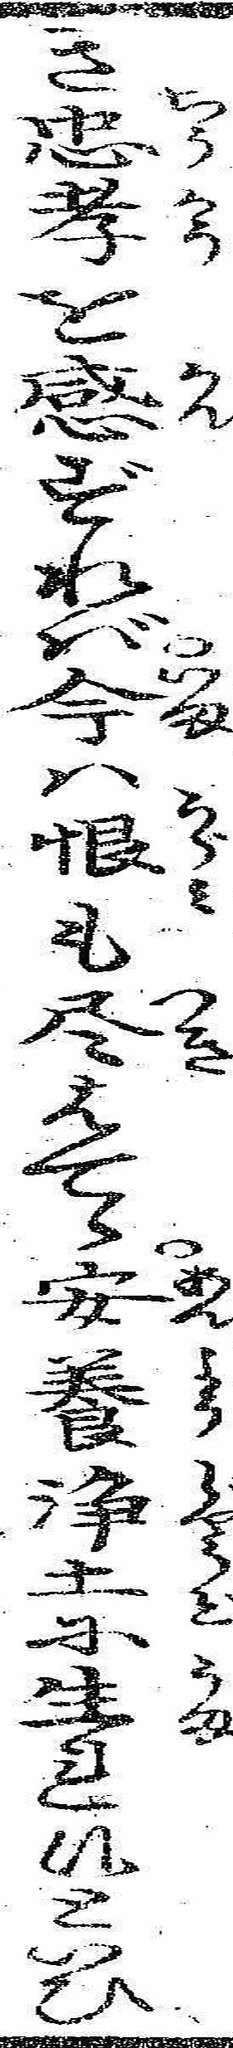き忠孝を感ずれば。今は恨も尽はてゝ。安養浄土に生れ候といひ
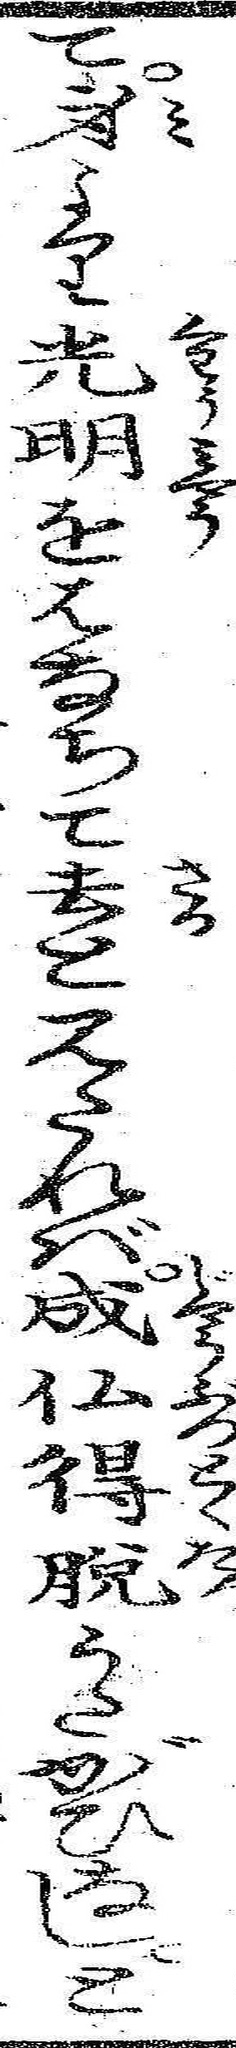て。身より光明をはなちて去と見たれば。成仏得脱うたがひなし。と
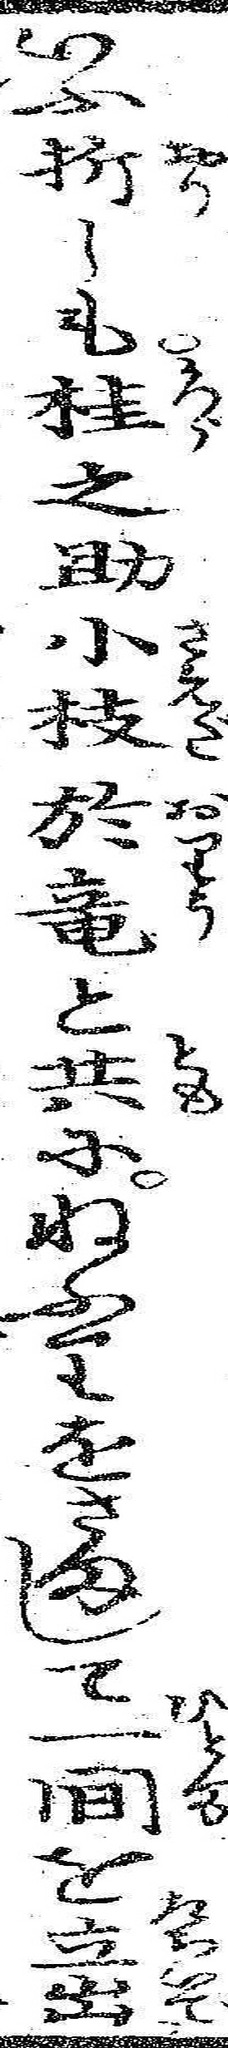いふ折しも。桂之助小枝於竜と共に。ねふりをさまして一間を立出
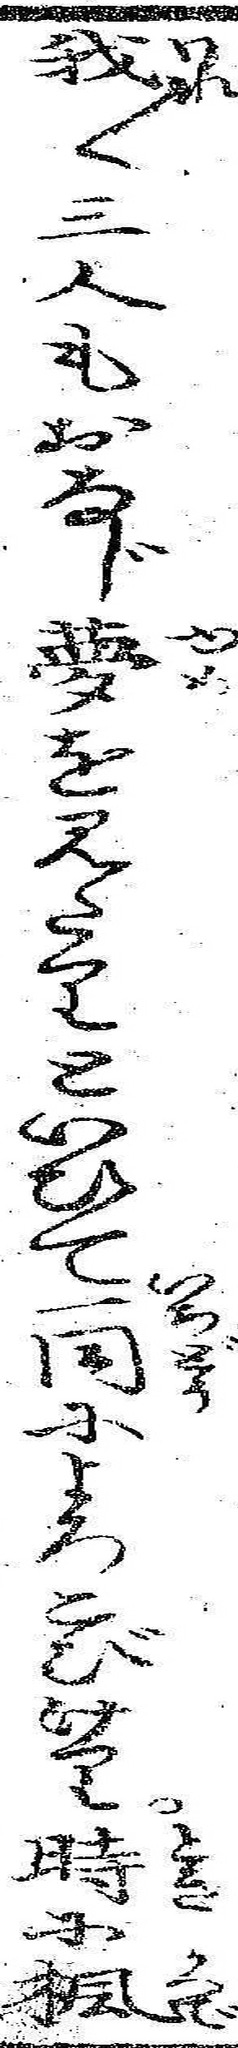我三人もおなじ夢を見たりといひて一同によろこびけり。時に楓
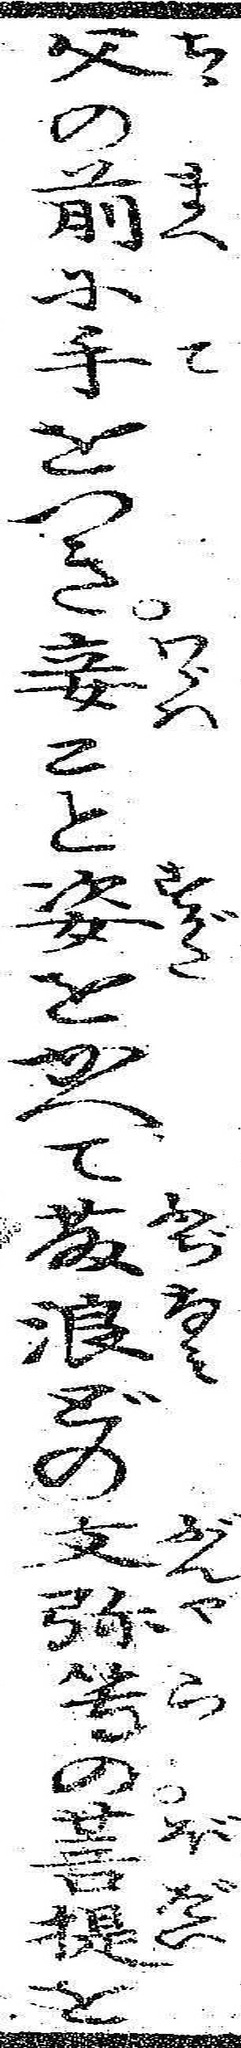父の前に手をつき。妾こと姿をかへて藤浪どの文弥等の。菩提を
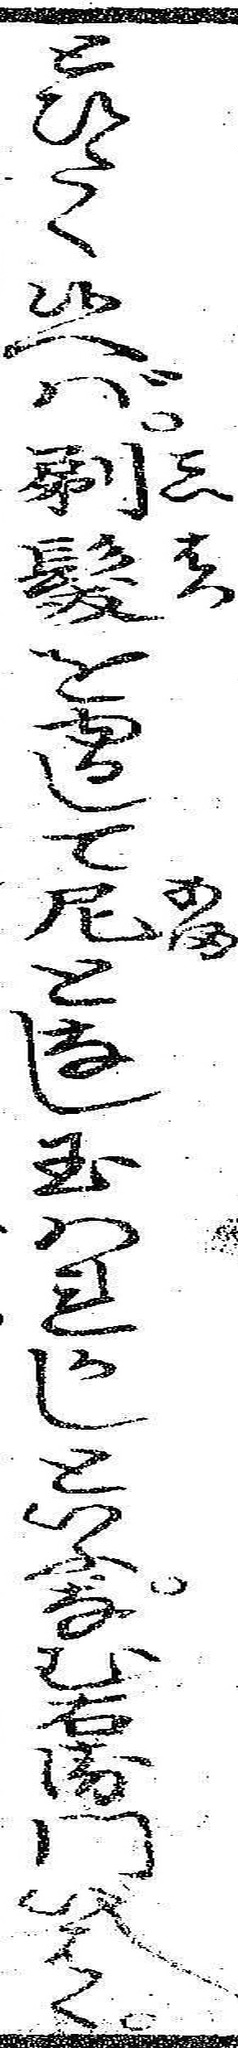とひたく候へば。剃髪をゆるして尼となし玉はれかしといふ。なむ右衛門いはく。
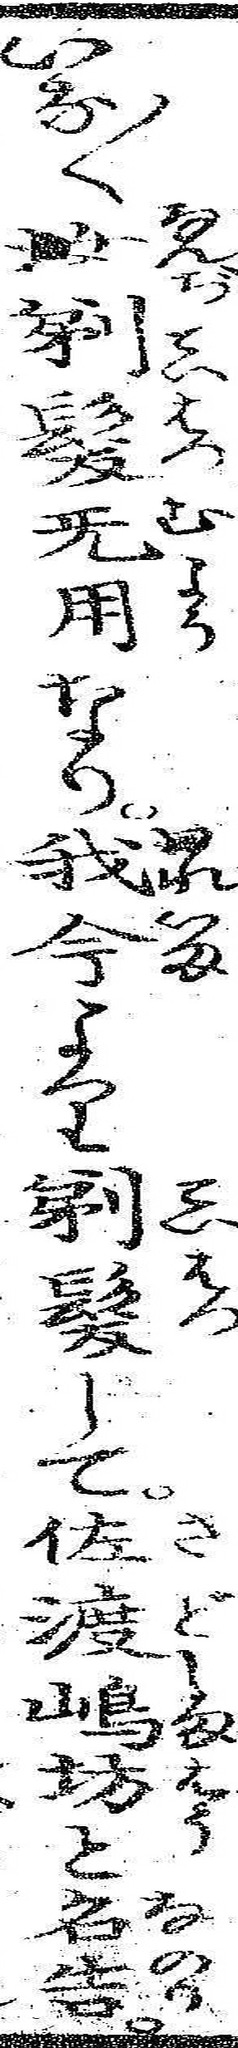いな〳〵汝剃髪無用なり。我今より剃髪して。佐渡島坊と名告。
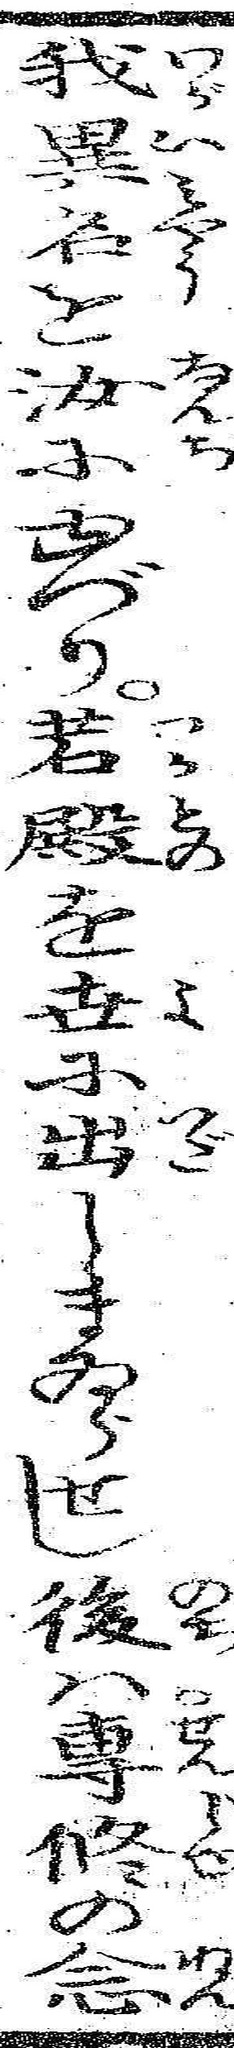我異名を汝にゆづり。若殿を世に出しまゐらせし後は。専修の念

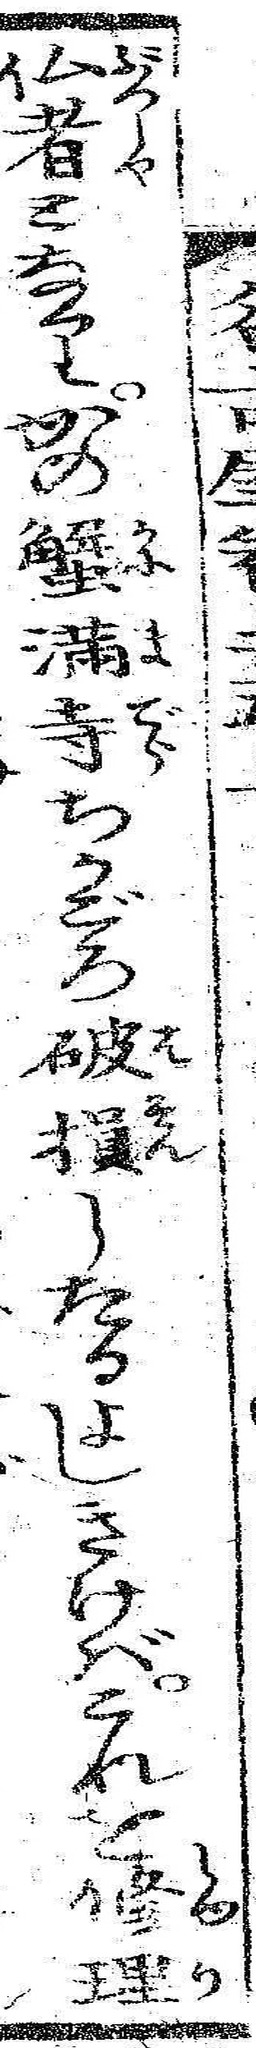仏者となり。かの蟹満寺ちかごろ破損したるよしきけば。これを修理
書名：昔話稲妻表紙
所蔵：国文学研究資料館
